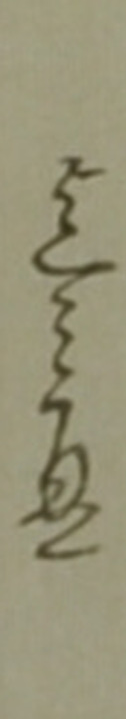迄之通
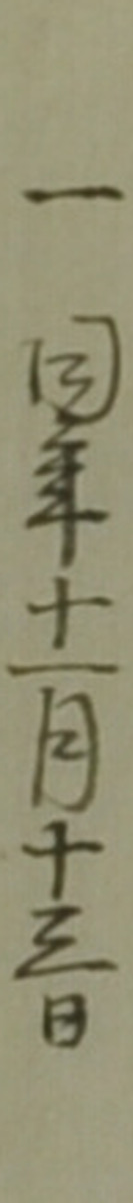一同年十一月十三日
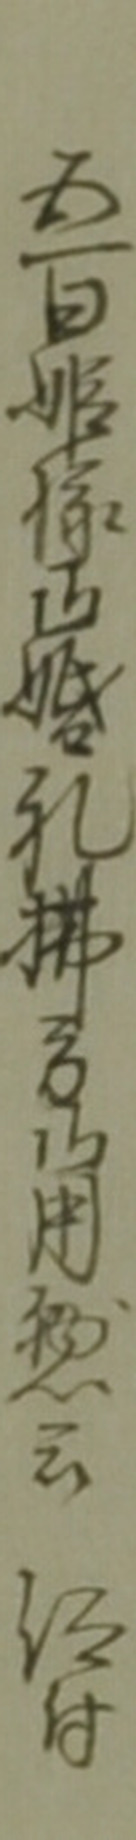五百姫様御婚礼払方御用懸被仰付
